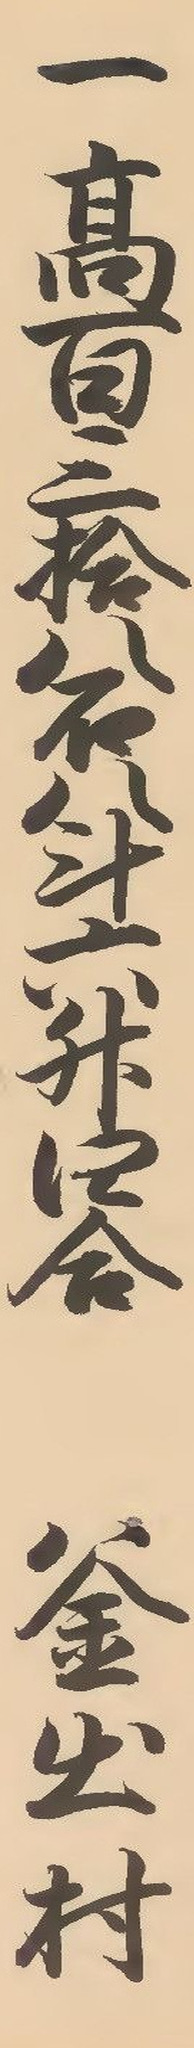一髙百三拾八石八斗六升四合釜出村
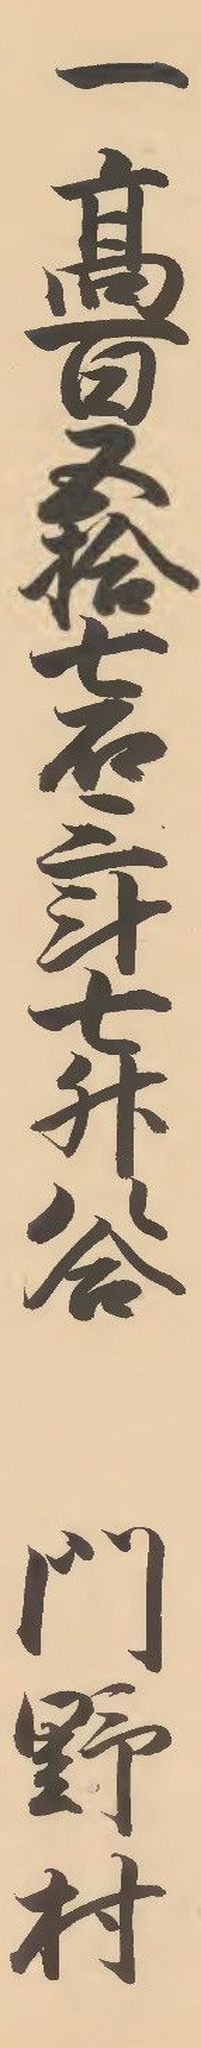一髙百五拾七石三斗七升八合門野村
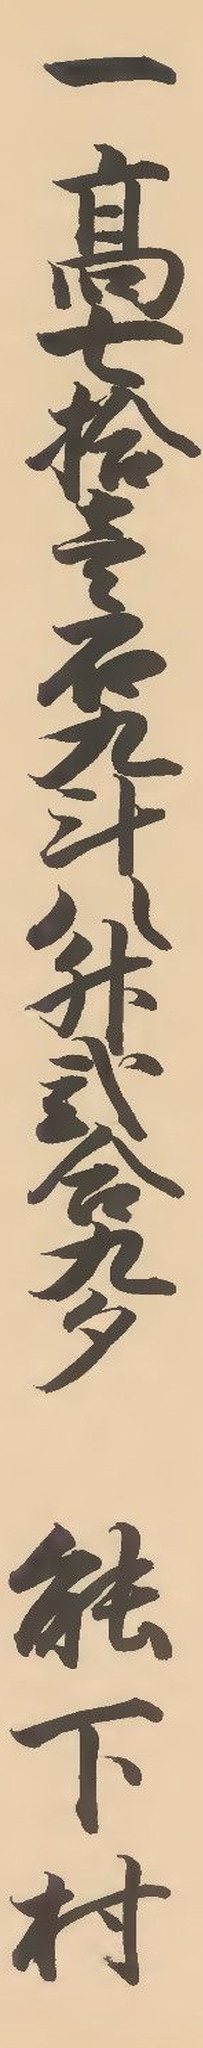一髙七拾壱石九斗八升弐合九夕能下村
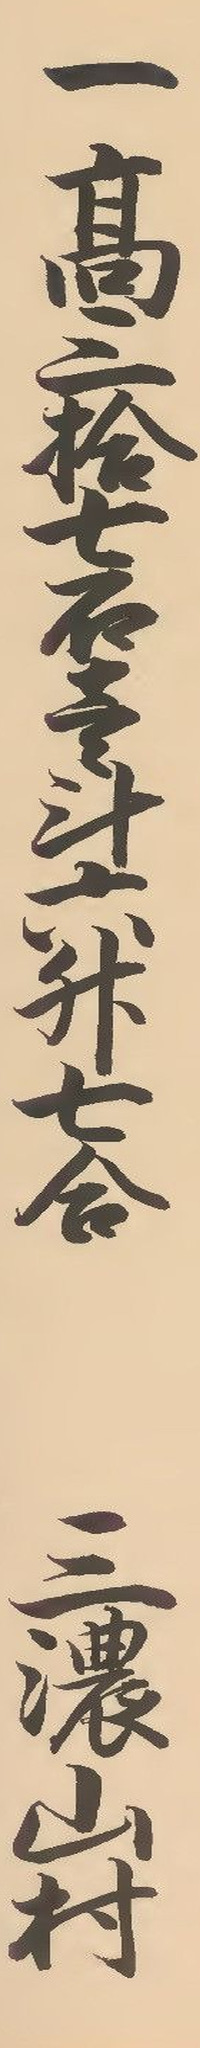一髙三拾七石壱斗六升七合三濃山村
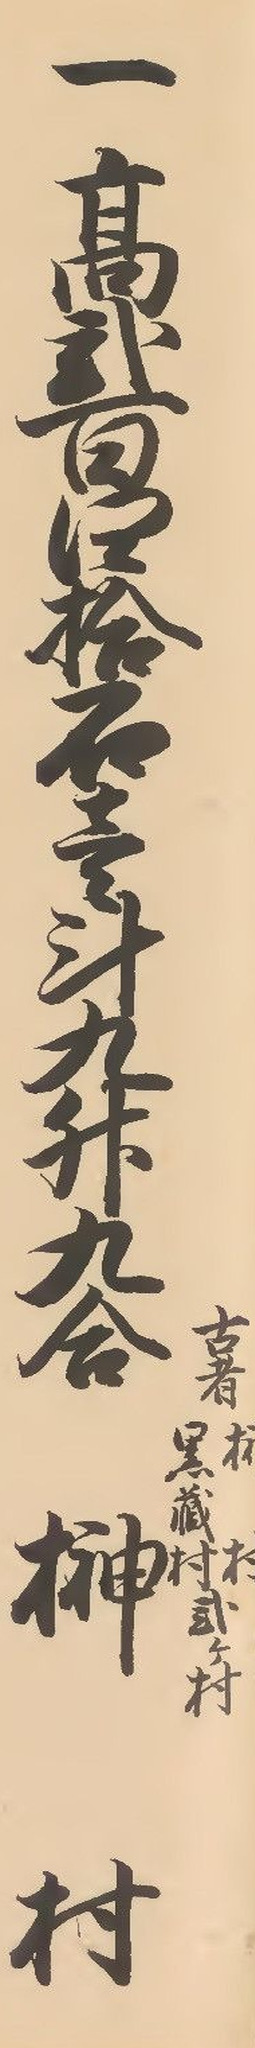一髙弐百四拾石壱斗九升九合榊村
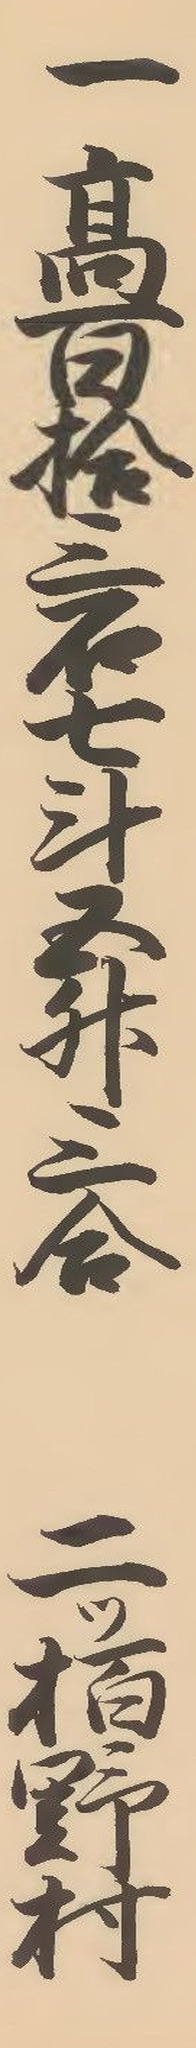一髙百拾三石七斗五升三合二ツ栢野村
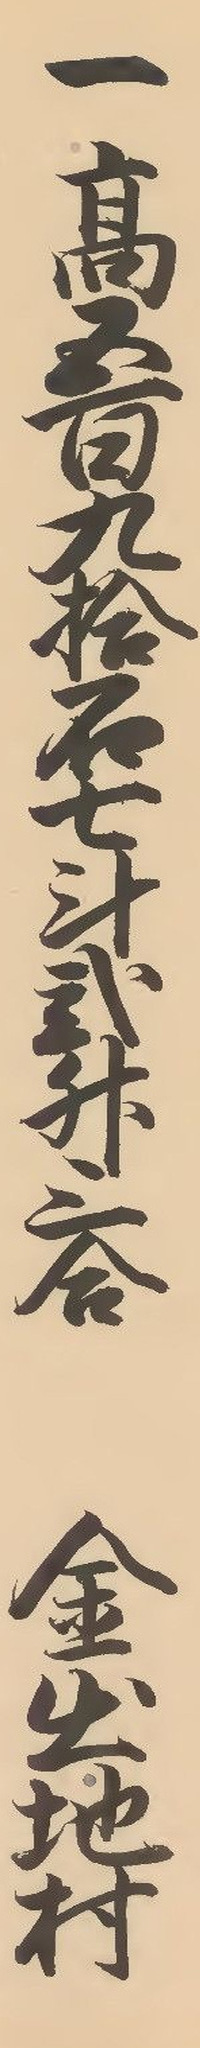一髙五百九拾石七斗弐升三合金出地村
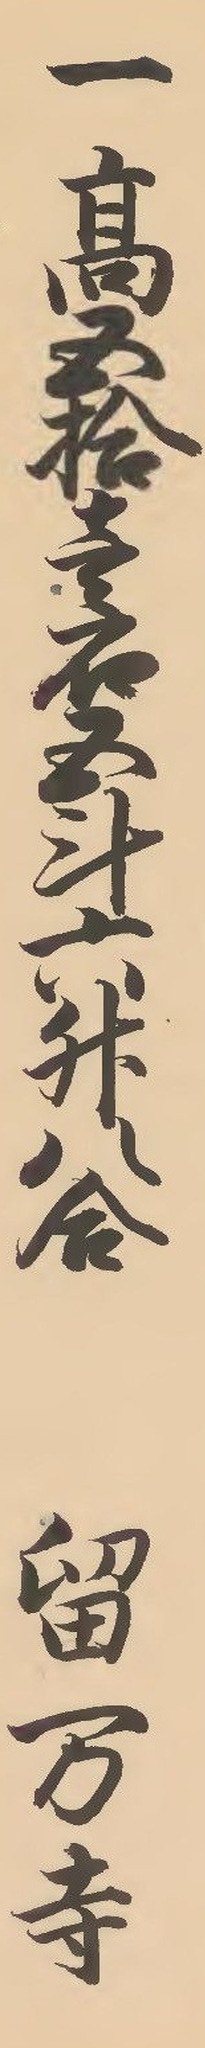一髙五拾壱石五斗六升八合留万寺

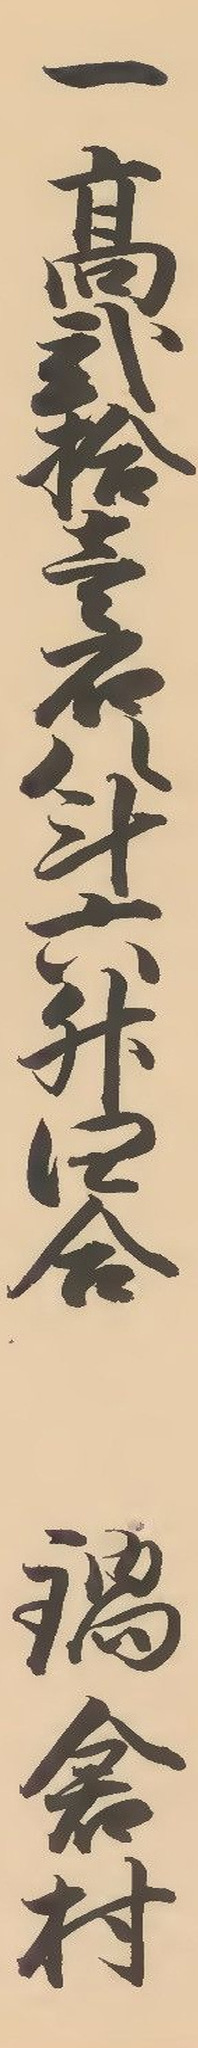一髙弐拾壱石八斗六升四合鍋倉村
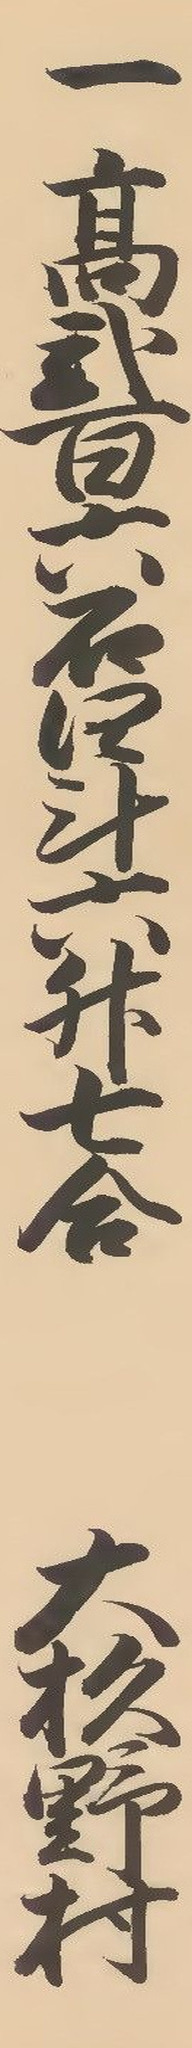一髙弐百六石四斗六升七合大杦野村
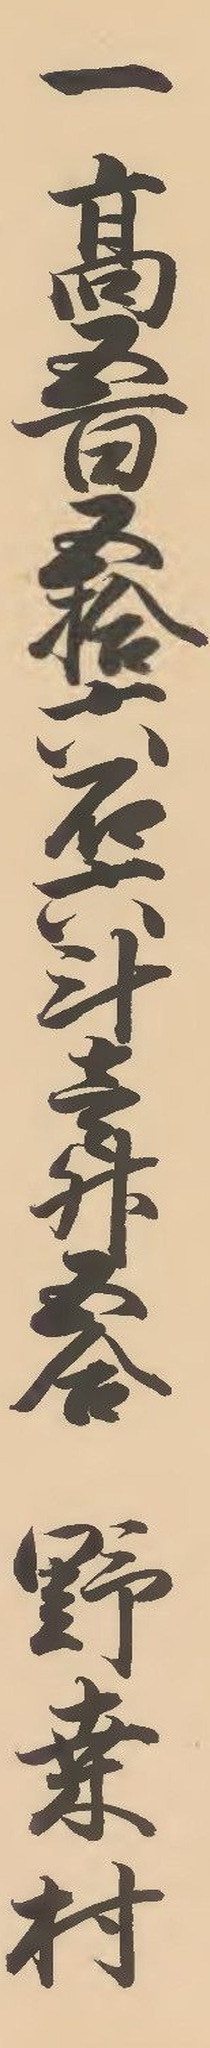一髙五百五拾六石六斗壱升五合野桑村
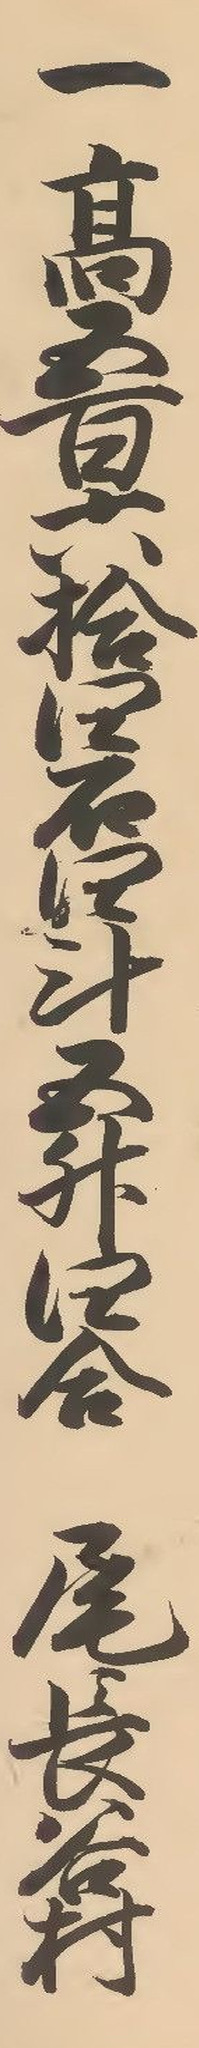一髙五百六拾四石四斗五升四合尾長谷村
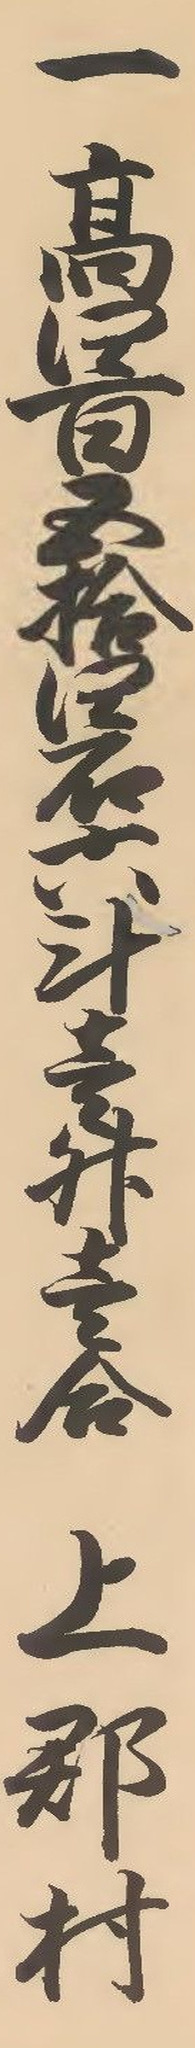一髙四百五拾四石六斗壱升壱合上郡村
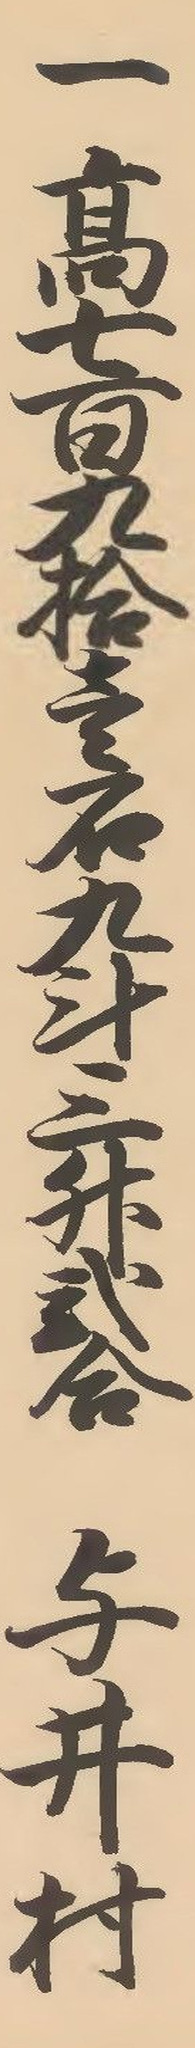一髙七百九拾壱石九斗三升弐合与井村
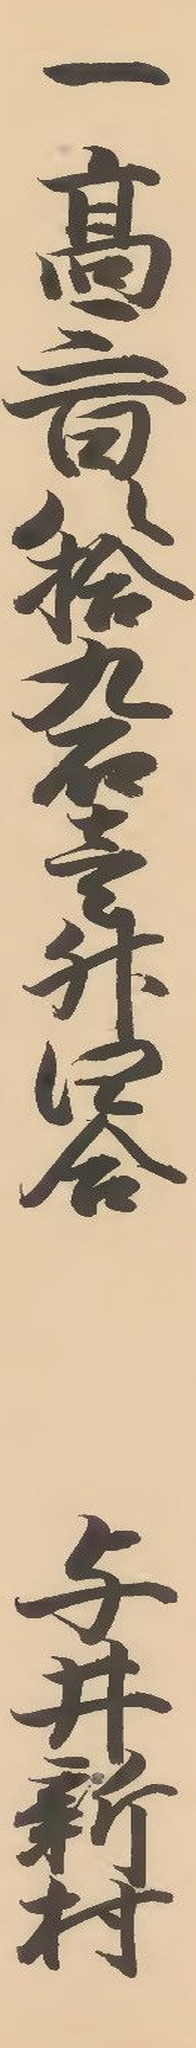一髙弐百八拾九石壱升四合与井新村
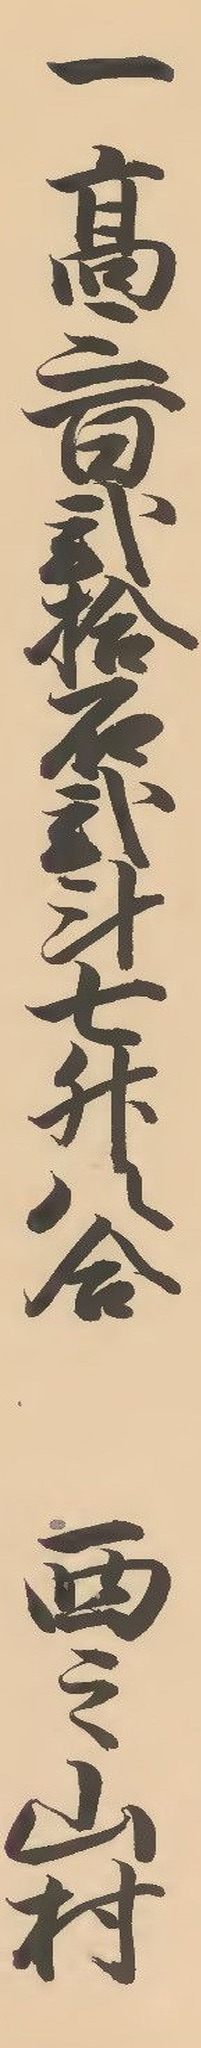一髙三百弐拾石弐斗七升八合西之山村
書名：播磨国郷帳
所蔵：国立公文書館 National Archives of Japan
